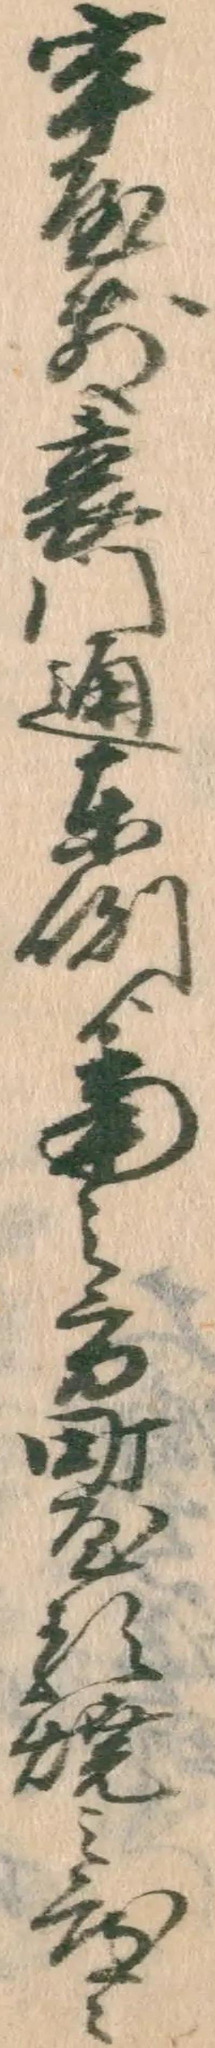牢屋敷裏門通東側ゟ南之方町屋類焼之度ニ
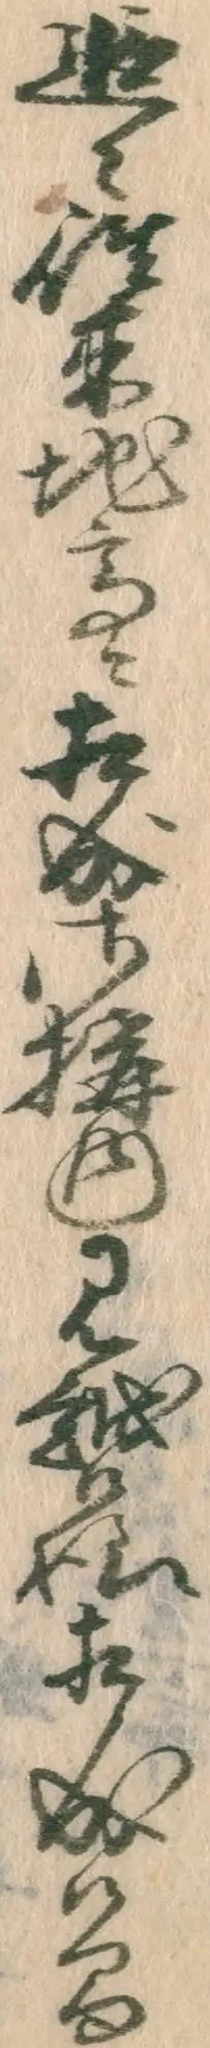追〻往来地高ニ相成御構内見越候様相成候間
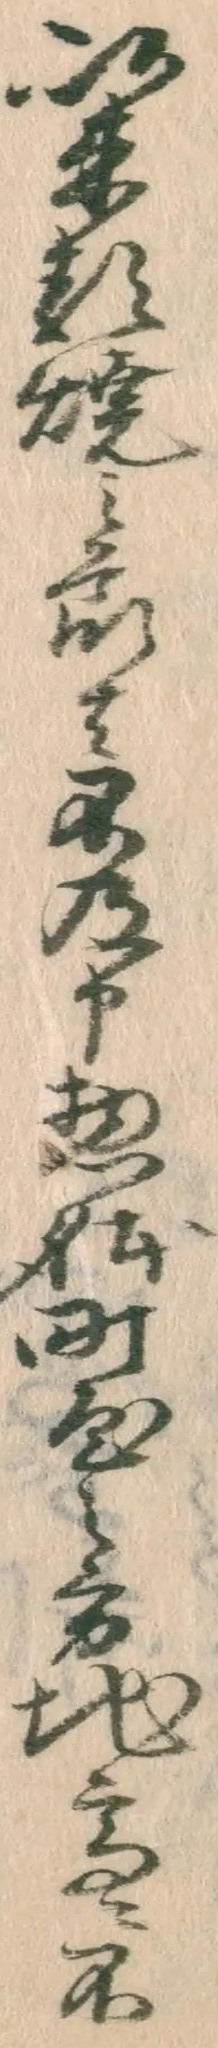以来類焼之節は不及申惣体町屋之方地高ニ不
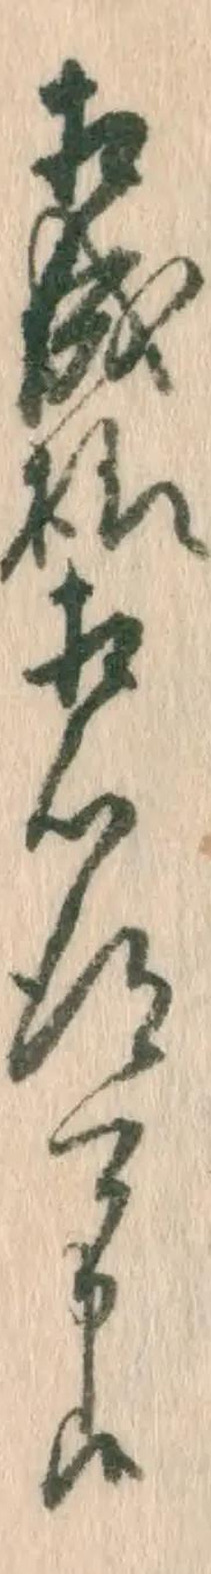相成様相心得可申候
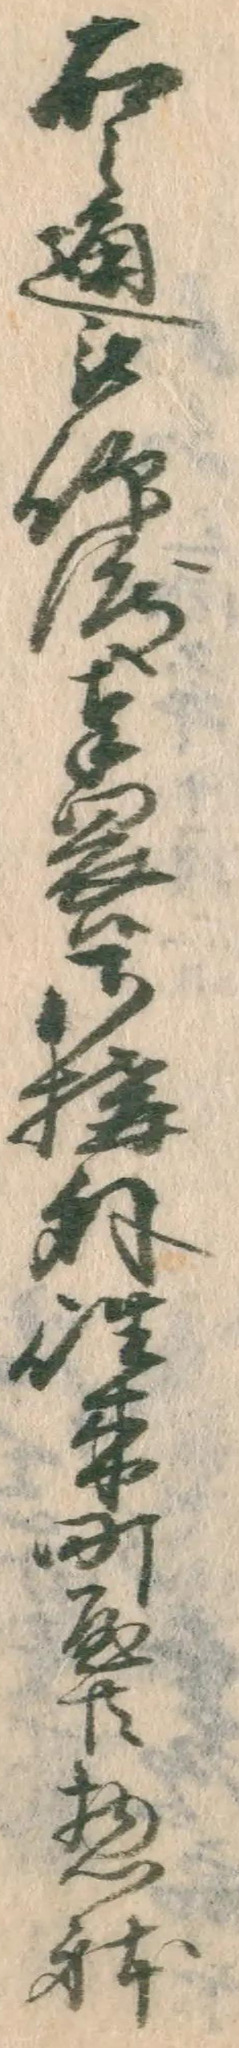右之通被仰渡奉畏候御構外往来町屋共惣体
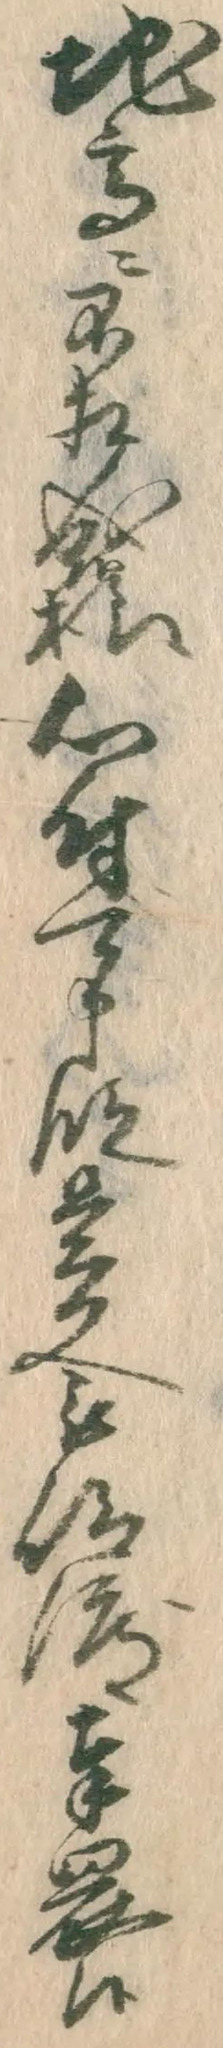地高ニ不相成様心付可申段是又被仰渡奉畏候

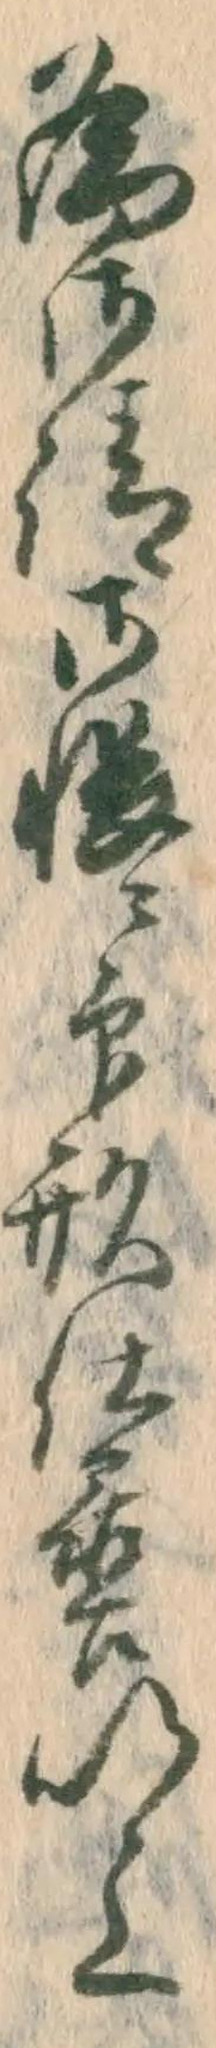為御請御帳ニ印形仕置候以上
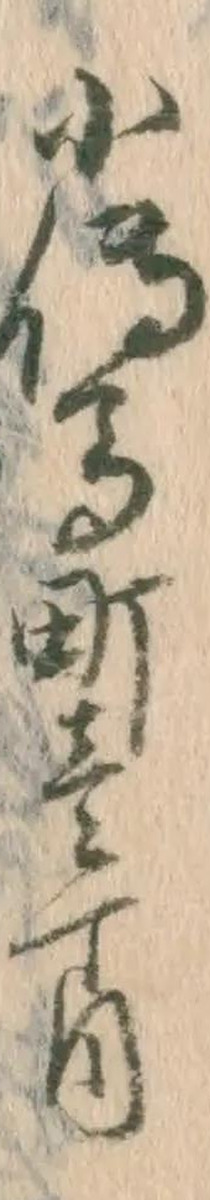小伝馬町壱丁目
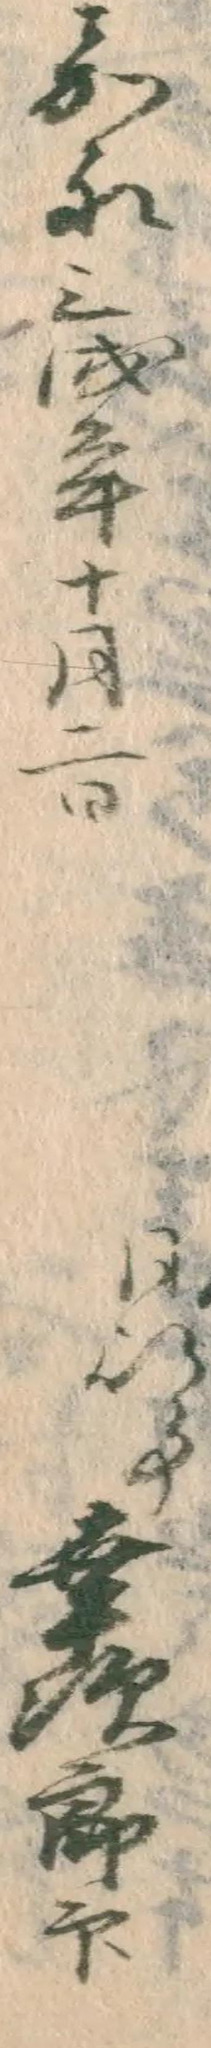嘉永三戌年十月二日月行事幸次郎印
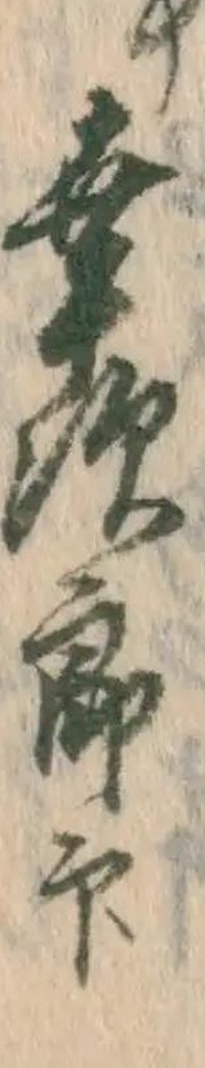同定次郎印
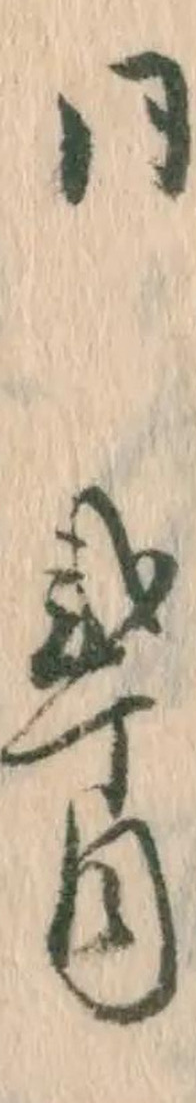同弐丁目
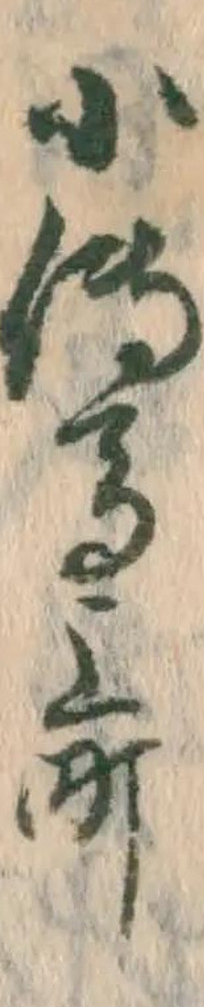小伝馬上町
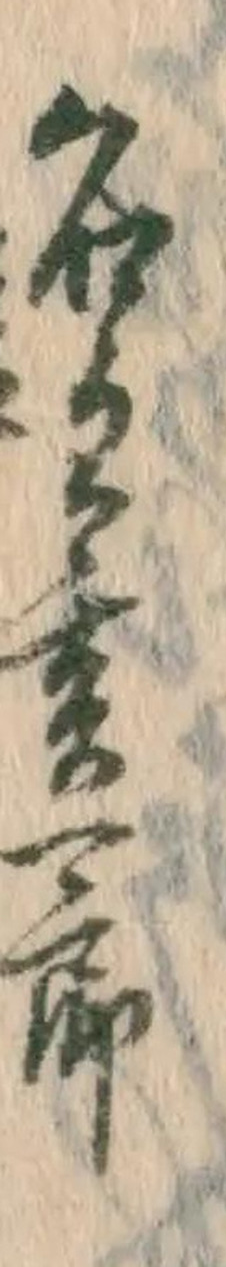名主亥一郎
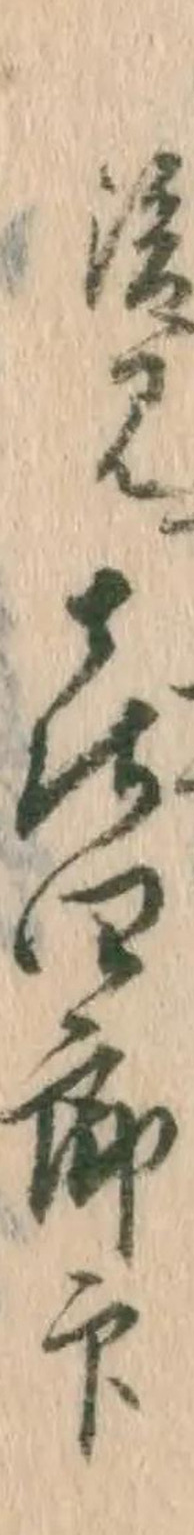後見喜四郎印
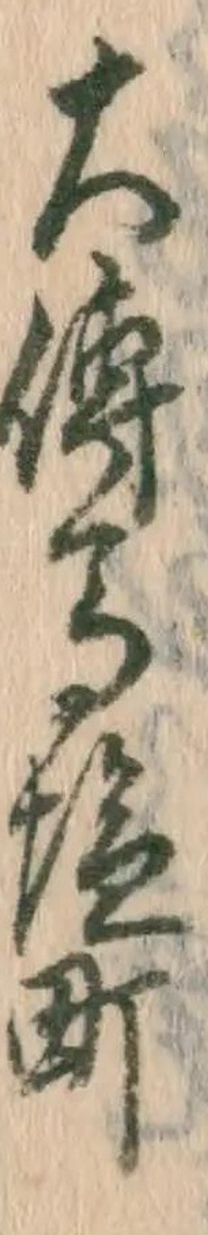大伝馬塩町
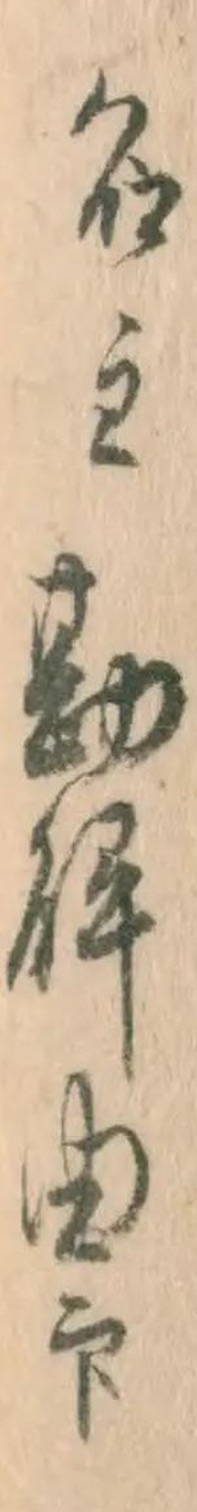名主勘解由印
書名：七十冊物類集 71巻. [44] 四十三 牢屋敷御普請御修覆地震ニ付骨折候牢屋掛御褒美之部
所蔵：国立国会図書館 National Diet Library, JAPAN
